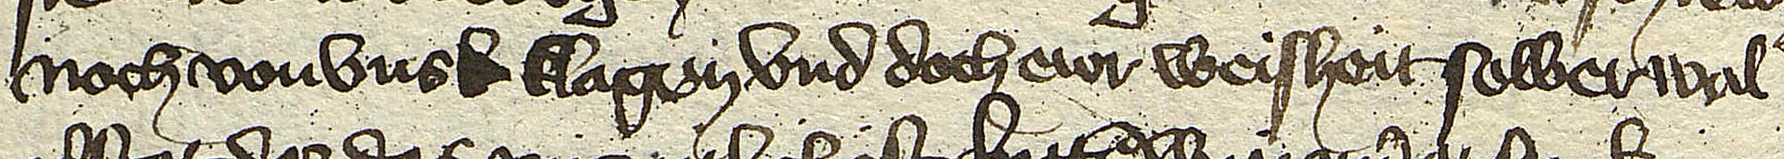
noch von vns k klagen vnd doch ewr weiſheit ſelber wol
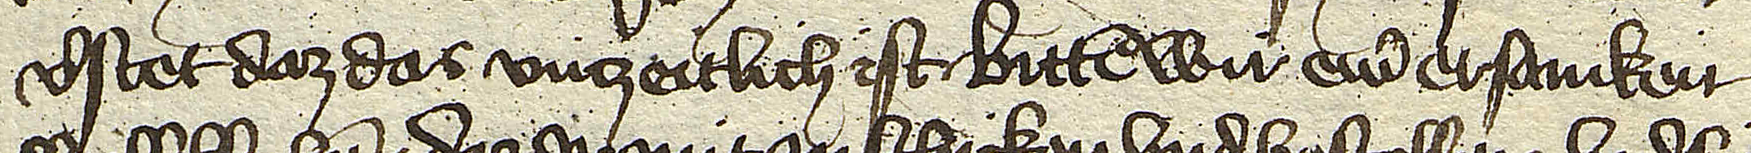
v*ſtet daʒ das vncʒeitlich iſt / Bitte* wir ew* erſamkeit
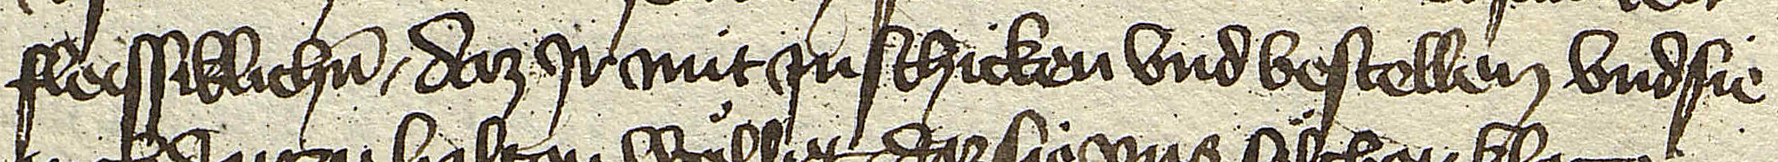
fleiſſiklichn* / daʒ Ir mit In ſchicken vnd beſtellen vnd ſie
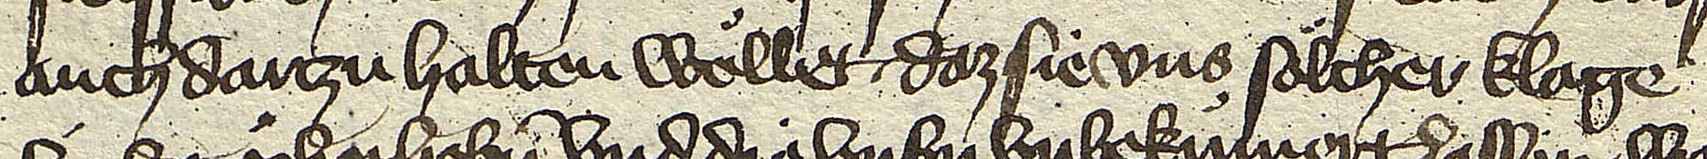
auch darcʒu halten wöllet / daʒ ſie vns ſölicher klage
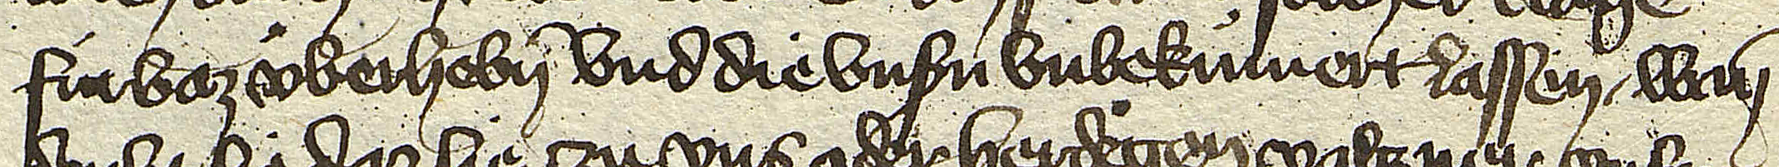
fürbaʒ v̈berhebn* vnd die vnſ*n vnbekümert laſſen / wan*
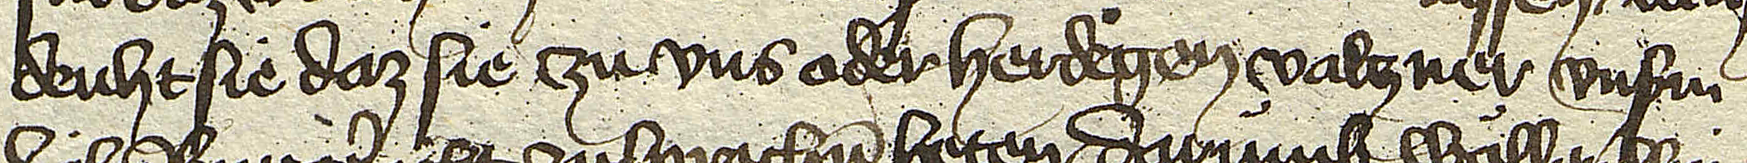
deuht ſie daʒ ſie cʒu vns oder herdegen valcʒner vnſ*m
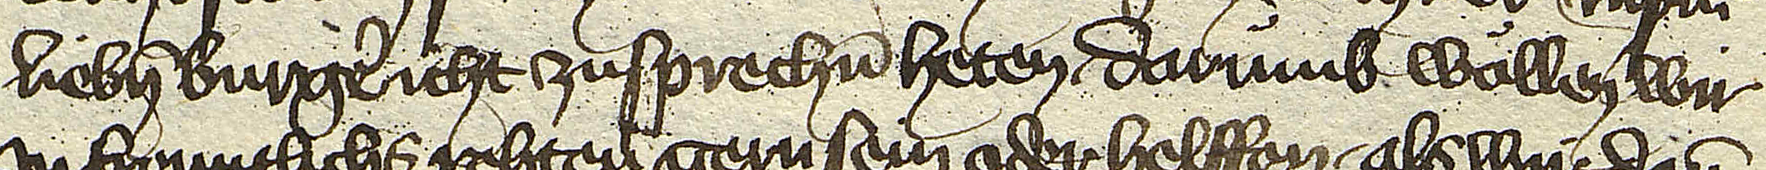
liebn* burge* icht cʒuſprechn* heten / darümb wöllen wir
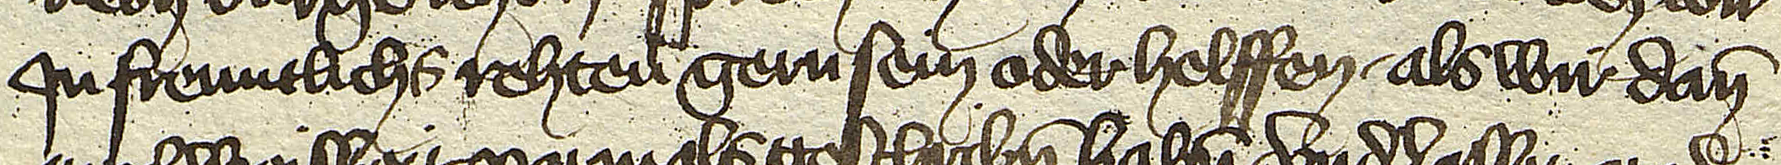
In freuntlichs rehten gern ſein oder helffen / als wir dan*
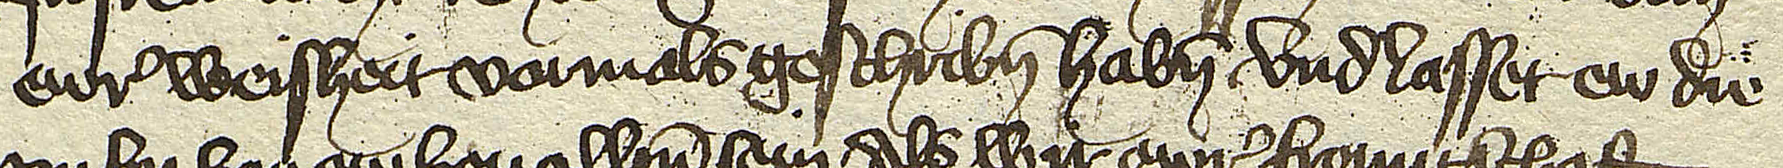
ewr* weiſheit vormals geſchribn* habn* / vnd laſſet ew die
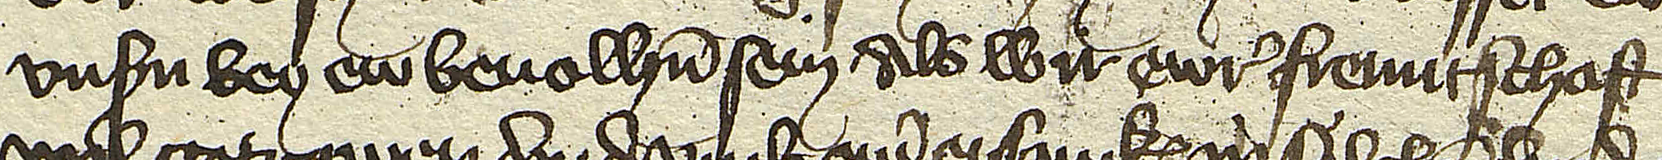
vnſ*n bey ew beuolhn* ſein / Als wir ewr* freuntſchaft
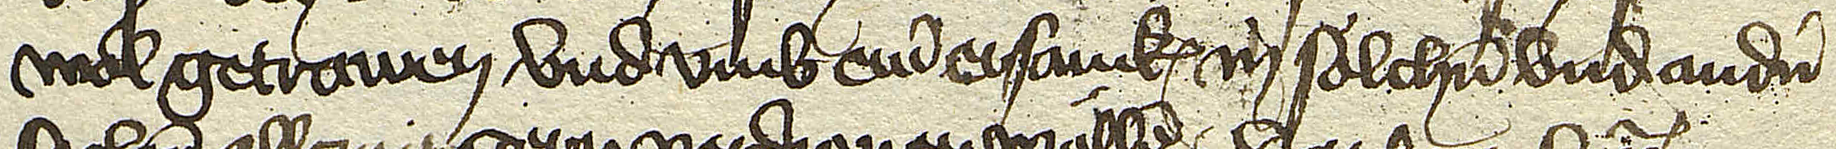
wol getrawen / vnd vmb ew* erſamk* in ſölichn* vnd andn*
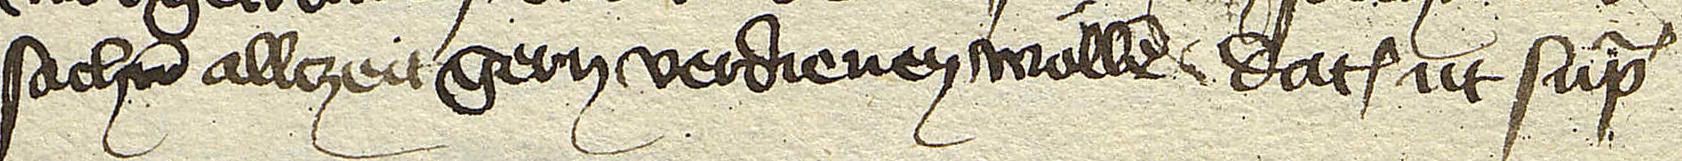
ſachn* allcʒeit gern verdienen wölle* / dat* ut ſup*
